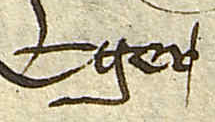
Eger
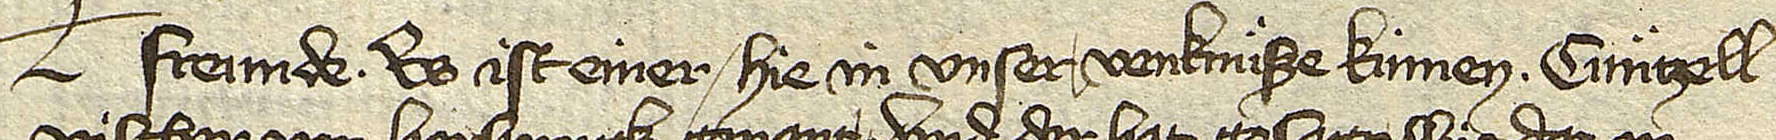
L* freunde . Es iſt einer / hie in vnſer venknüſʒe kumen . Cüncʒell
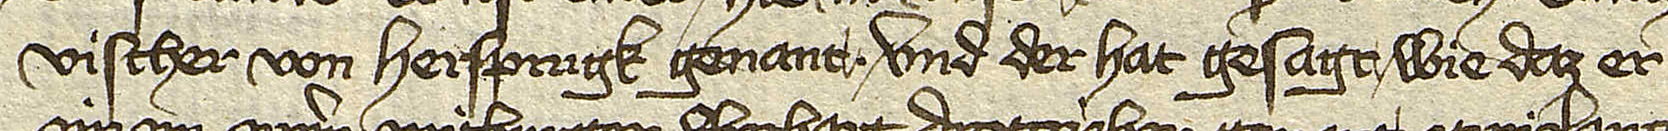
viſcher von herſprugk genant . vnd der hat geſagt wie daʒ er
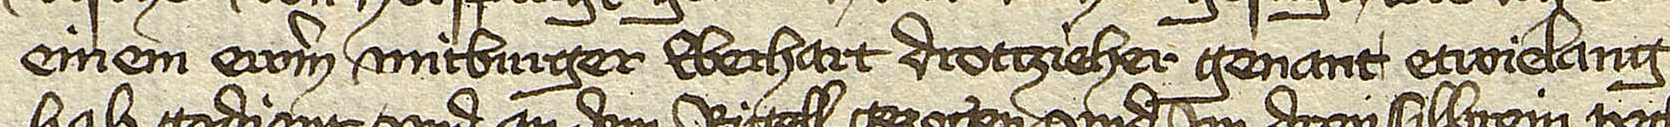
einen ewm* mitburger Eberhart drotcʒieher genant / etwielang
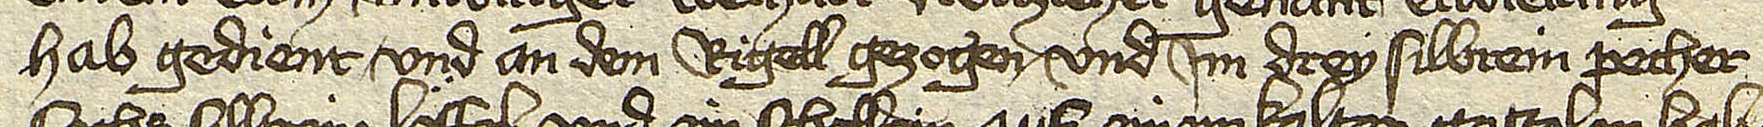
hab gedient / vnd an dem Rigell geʒogen / vnd Im drey ſilbrein pecher
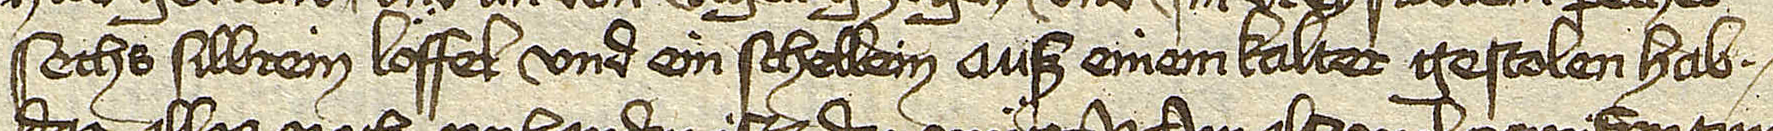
ſechs ſilbrein löffel vnd ein ſchellein auſʒ einem kalter geſtolen hab . /
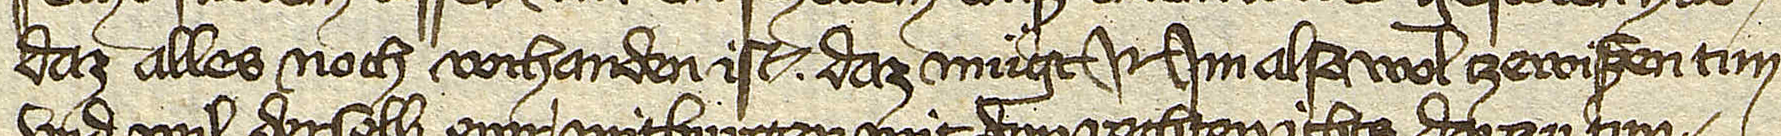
daʒ alles noch vorhanden iſt . daʒ mügt Ir Im alſo wol cʒewiſʒen tun
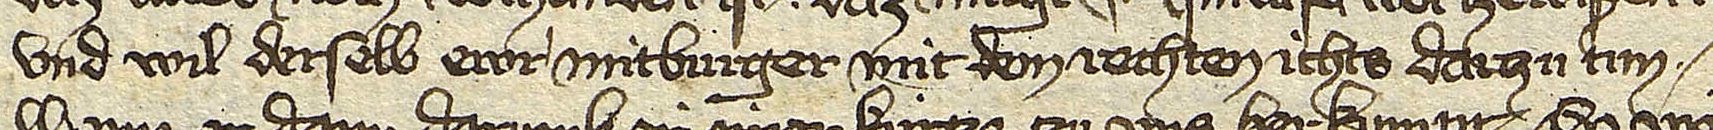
vnd wil derſelb ewr mitburger mit dem rechten ichts darcʒu tun . /
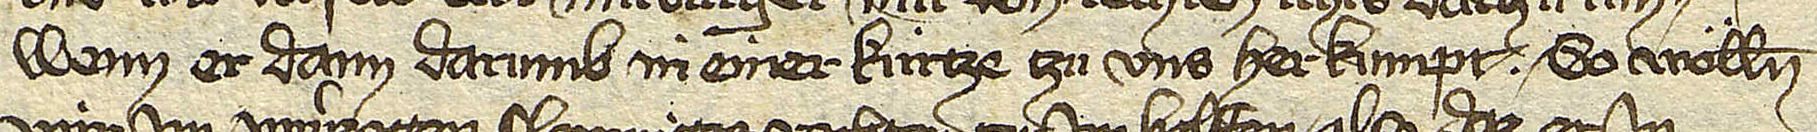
wenn er dann darumb in einer kürcʒe cʒu vns her kumpt . / So wölln*
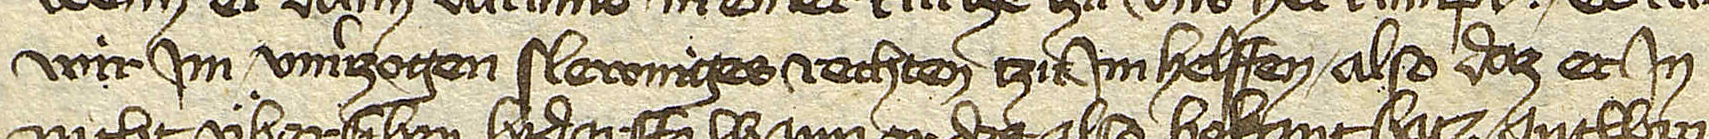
wir Im / vnu*cʒogen ſlewniges rechten cʒu Im helffen / alſo daʒ er In
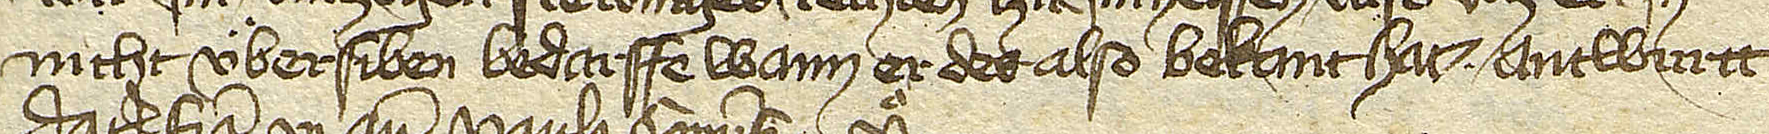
nicht v̈berſiben bedarffe wann er des alſo bekant hat / . antwurtt
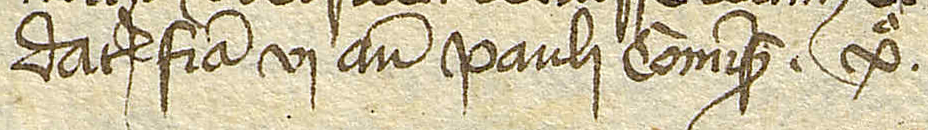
dat* fia* vi an* Pauli Comiſ* . x* .
